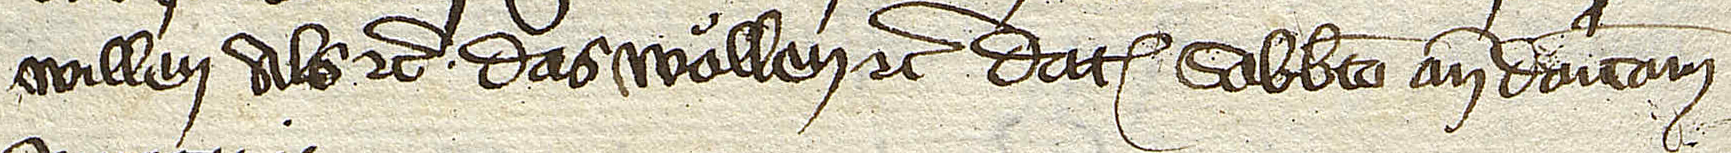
willen Als ec* . Das wöllen ec* Dat* Sabbto* an* do*icam
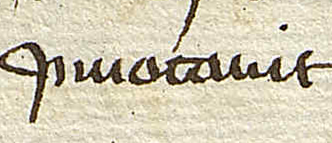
Inuocauit
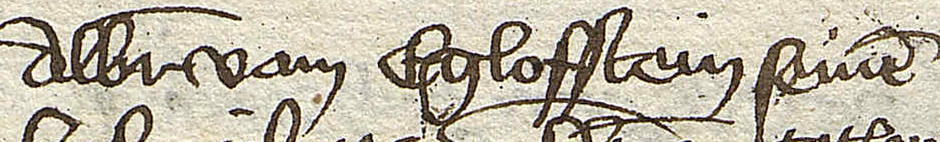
Albr* vom Eglofſtein ſeine*
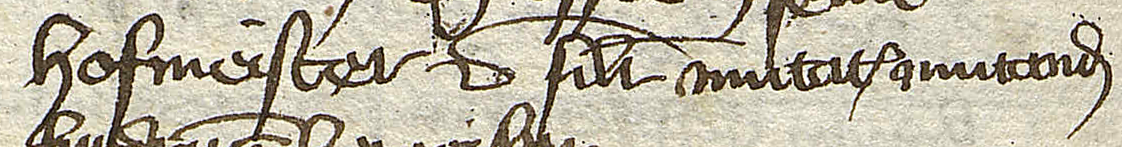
hofmeiſter ec* ſilr* mutat* mutand*
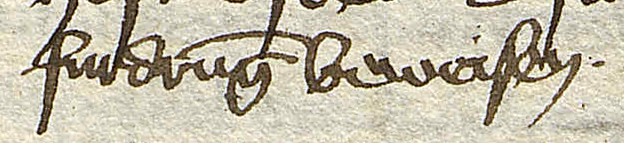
furdru*g beweiſen .
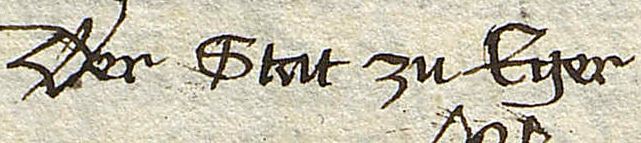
Der Stat ʒu Eger
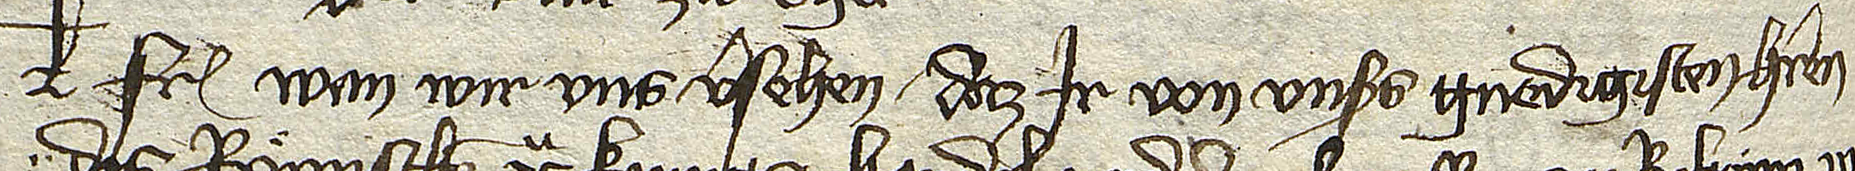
L* fr* wan wir vns v*ſehen / daʒ Ir von vnſ*s gnedigiſten h*ren
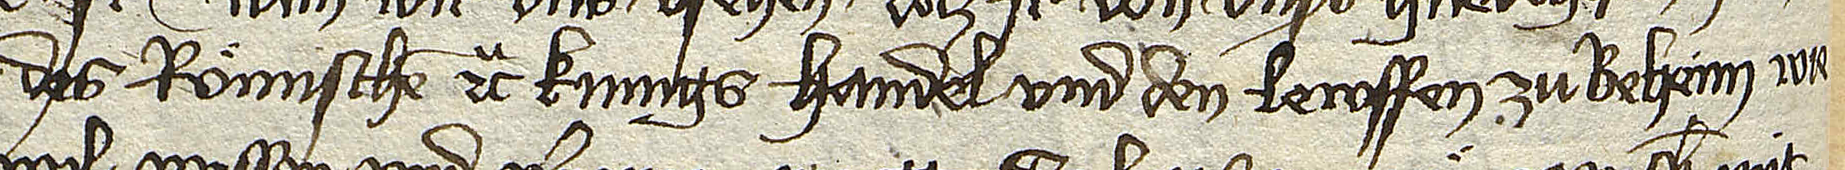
~ des Römiſche* ec* kunigs handel vnd den lewffen ʒu Beheim wie
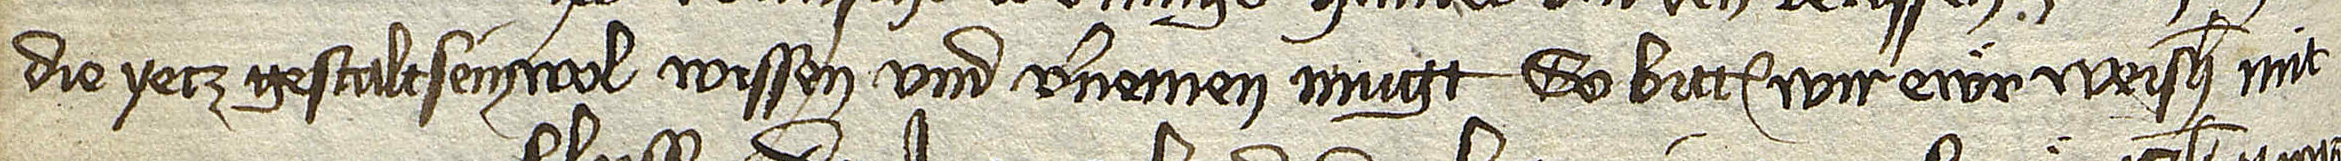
die yecʒ geſtalt ſein wol wiſſen vnd v*nemen mugt So bitt* wir eẅr weiſh* mit
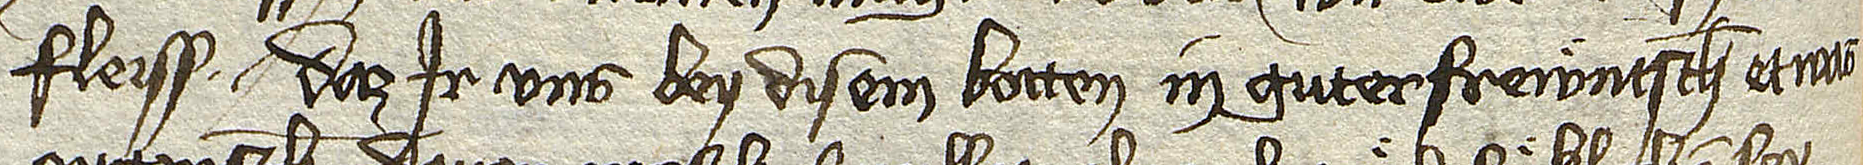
fleiſſ . / Daʒ Ir vns bey diſem botten in guter freẅntſch* etwas
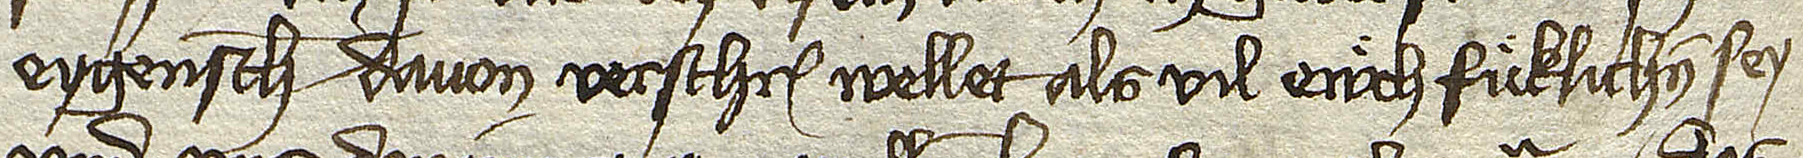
eygenſch* / dauon verſchr* wellet als vil eẅch füklichn* ſey
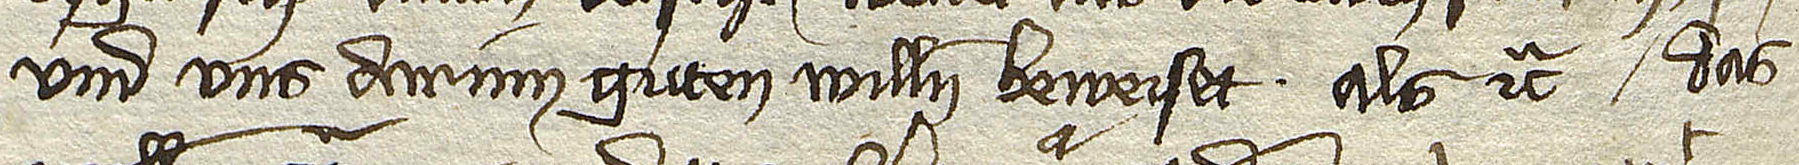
vnd vns darinn guten willn* beweiſet . als ec* / das
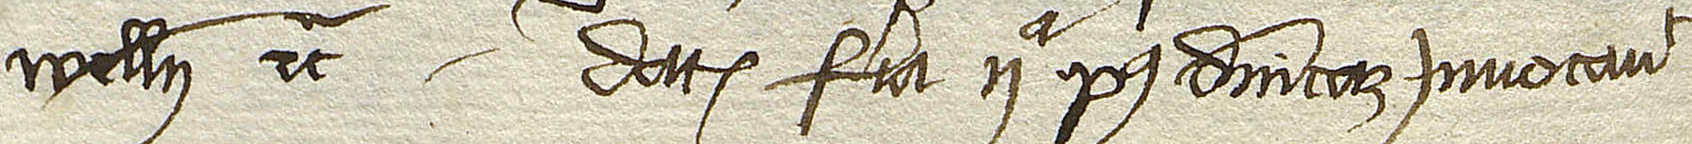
welln* ec* / Dat* fi*a ii* p* d*nica* Inuocau*
